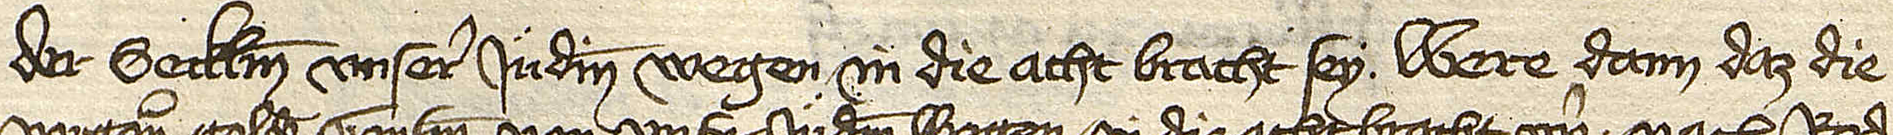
der Secklin* vnſer* Iüdin* wegen / in die acht bracht ſey . Were dann daʒ die
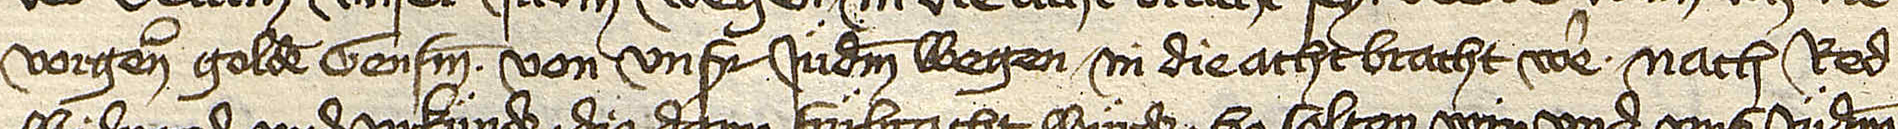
vorgen* golde Genfin* . von vnſ*r Iüdin* wegen / in die acht bracht w*e . / Nach Red
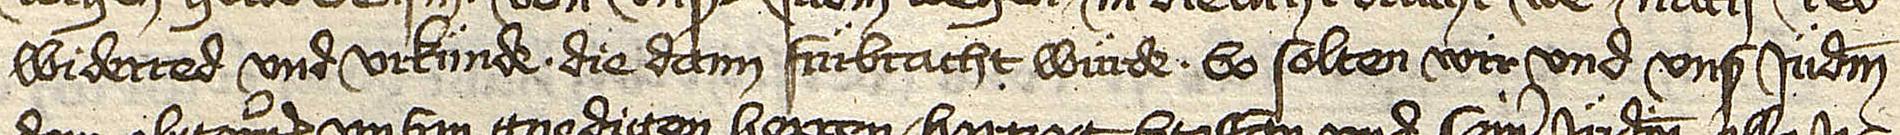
widerred vnd vrkünde . die dann fürbracht würde . So ſolten wir vnd vnſ* Iüdin*
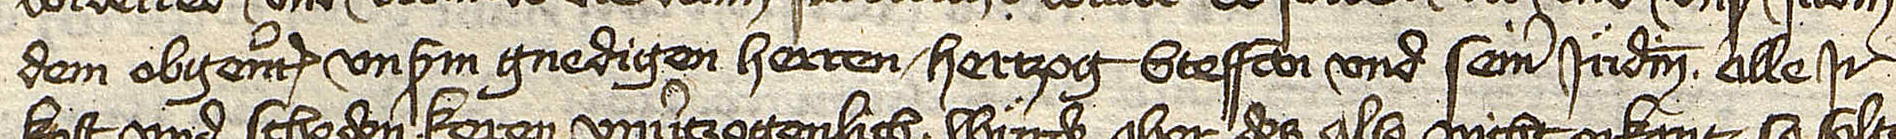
dem obgen*t* vnſ*m gnedigen herren / hercʒog Steffan vnd ſein* Iüdin* . alle Ir
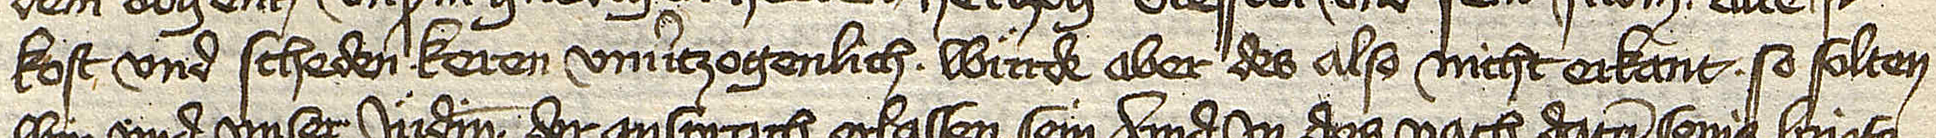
koſt vnd ſcheden . keren vnu*cʒgenlich . würde aber des alſo nicht erkant . ſo ſolten
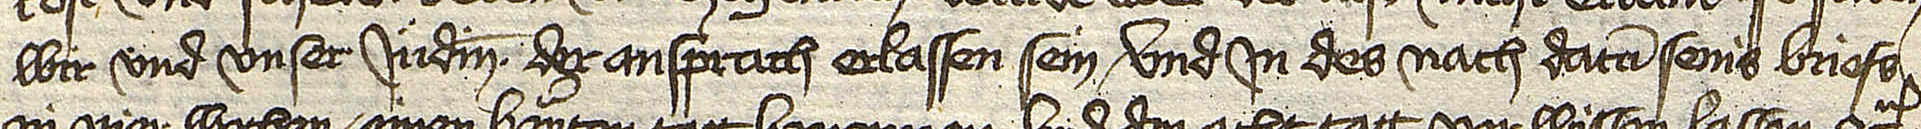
wir vnd vnſer Iüdin* . der anſprach erlaſſen ſein / Vnd In des nach datu* ſeins briefs
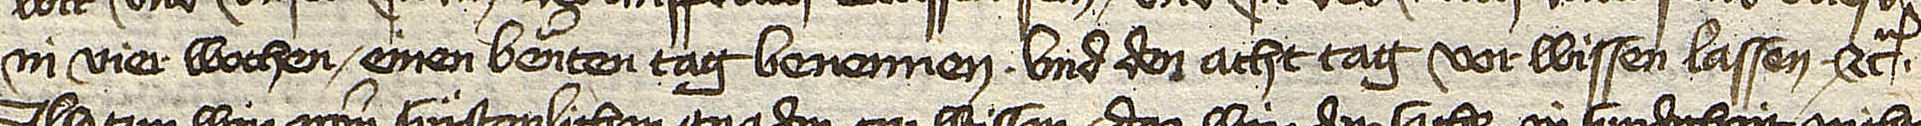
in vier wochen / einen benten tag benennen . Vnd des acht tag vor wiſſen laſſen ec* .
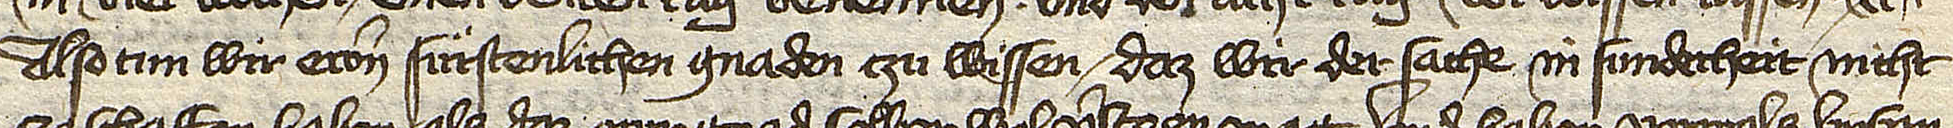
Alſo tun wir ew*n fürſtenlichen gnaden cʒu wiſſen / daʒ wir der ſache in ſunderheit nicht
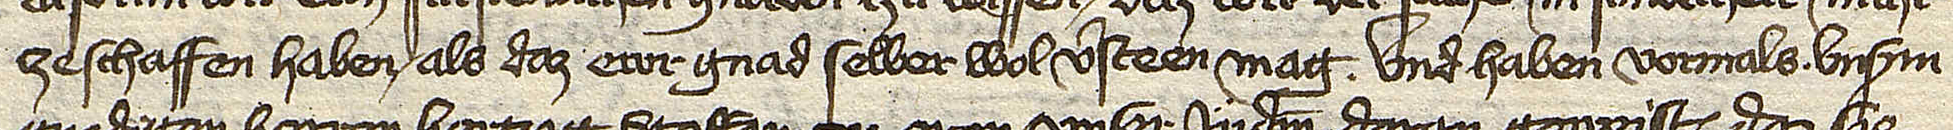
cʒeſchaffen haben / als daʒ ewr gnad ſelber wol v*ſteen mag . Vnd haben vormals . vnſ*m
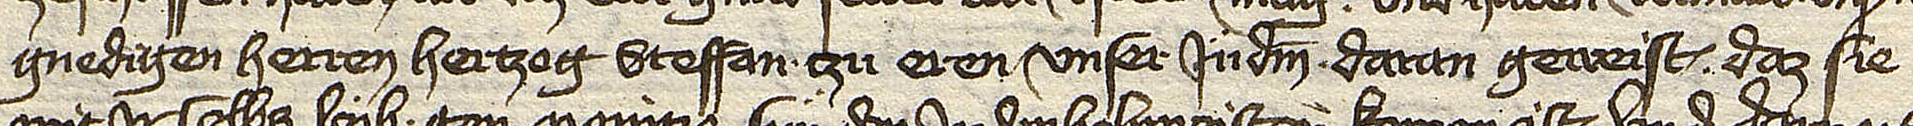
gnedigen herren hercʒog Steffan . cʒu eren / vnſer Iüdin* daran geweiſt / daʒ ſie
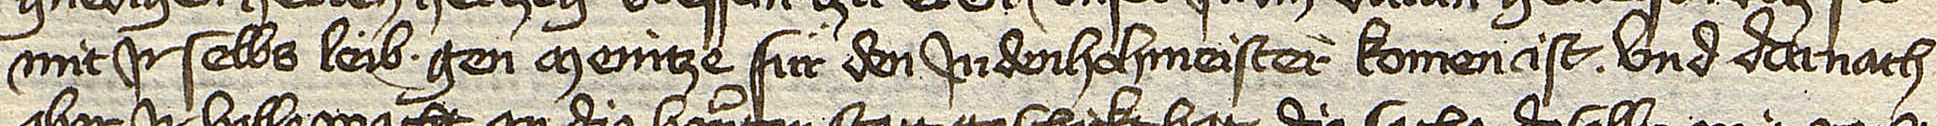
mit Ir ſelbs leib . gen Meincʒe für den Iudenhohmeiſter komen iſt / . Vnd darnach
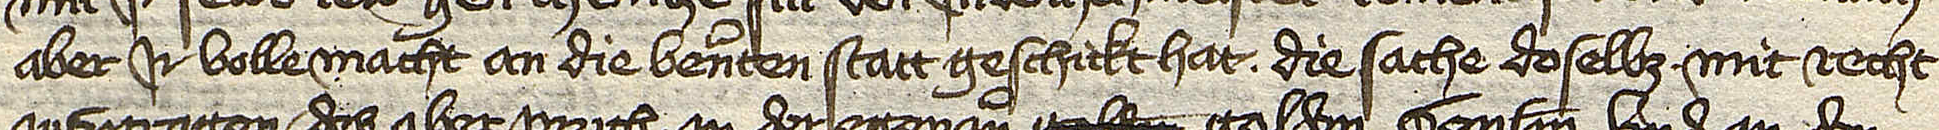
aber Ir volle macht an die benten* ſtatt geſchickt hat . die ſache doſelbʒ mit recht
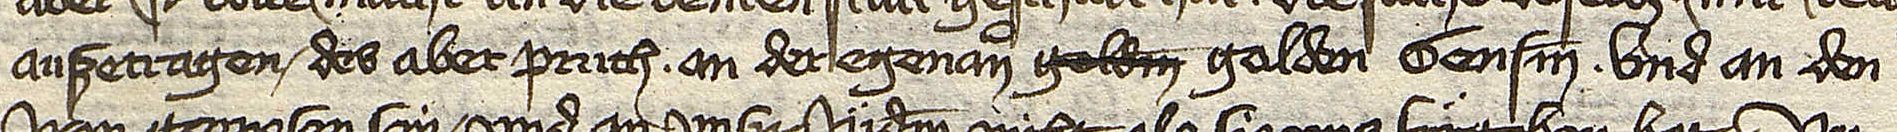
auſʒetragen / des aber pruch . an der egenan* goldin* golden Genſin* . Vnd an den
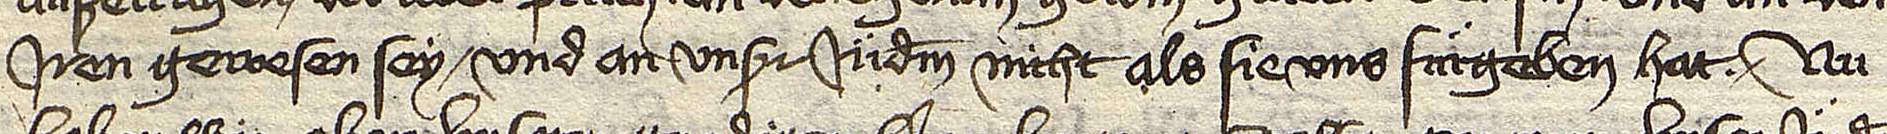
Iren geweſen ſey / vnd an vnſ*r Iüdin* nicht als ſie vns fürgeben hat . / Nu
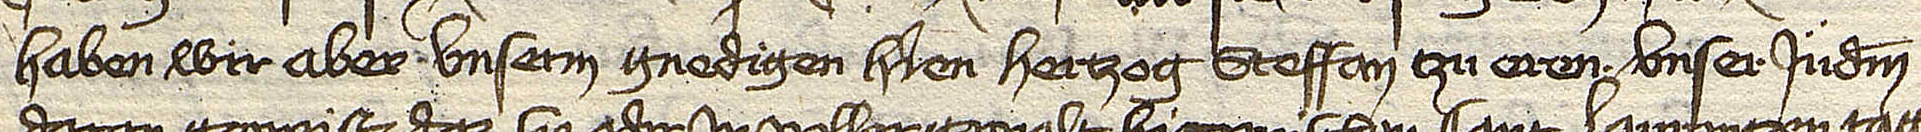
haben wir aber vnſerm gnedigen h*ren hercʒog Steffan cʒu eren . vnſer Iüdin*
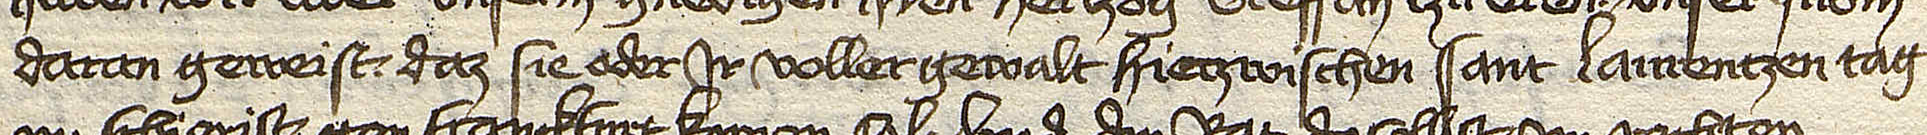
daran geweiſt . daʒ ſie oder Ir voller gewalt hiecʒiſchen ſant laurencʒen tag
